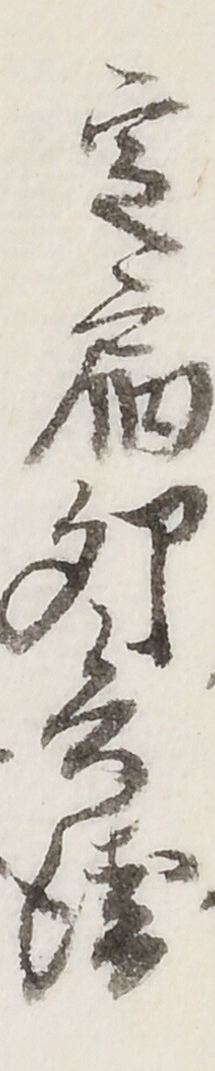定宿卯兵衛
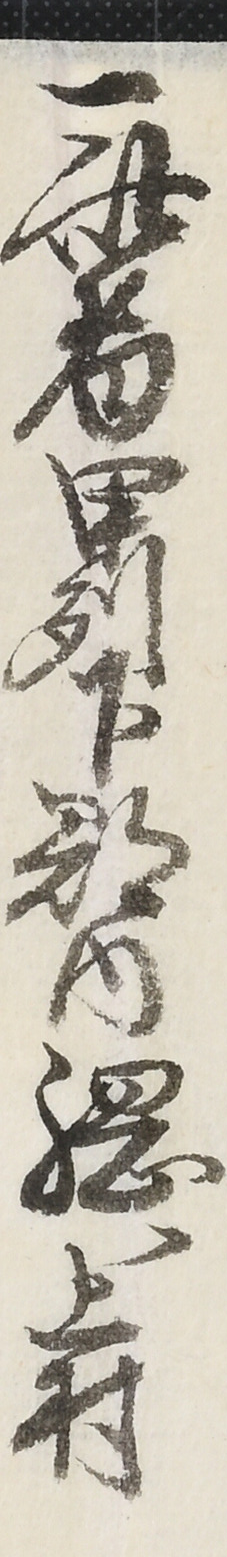一此者甲州下郡内綱上村
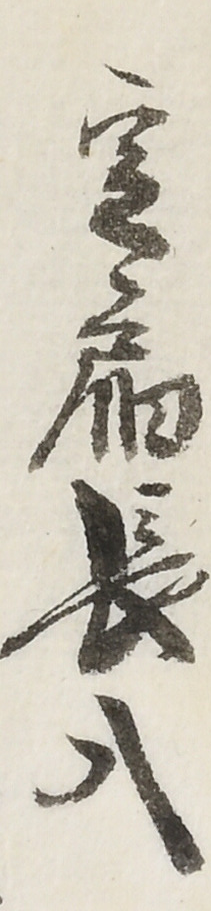定宿長八
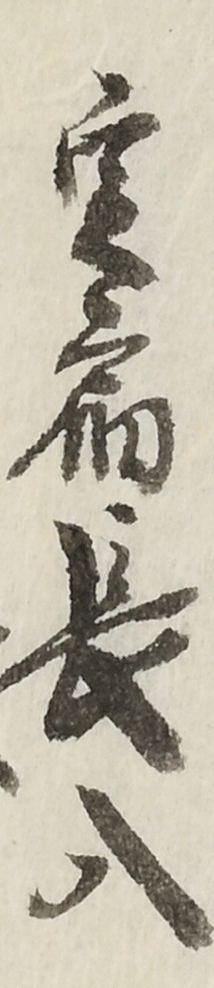定宿長八
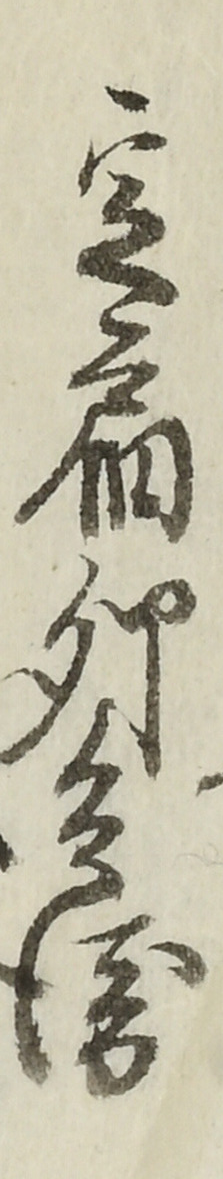定宿卯兵衛

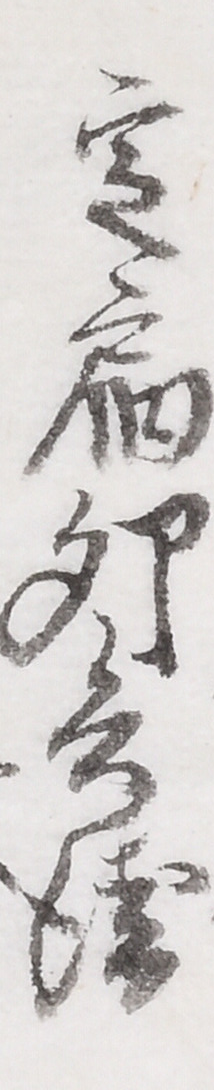定宿卯兵衛
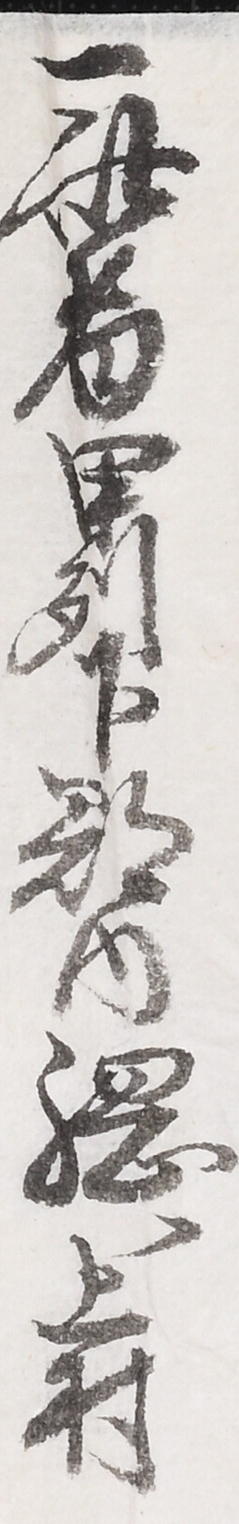此者甲州下郡内綱之上村
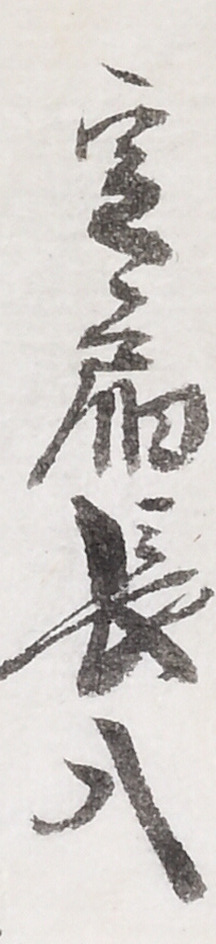定宿長八
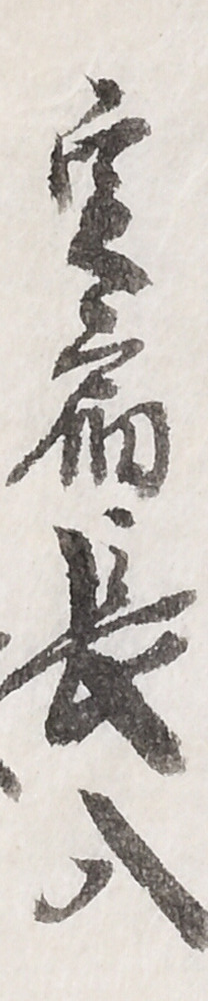定宿長八
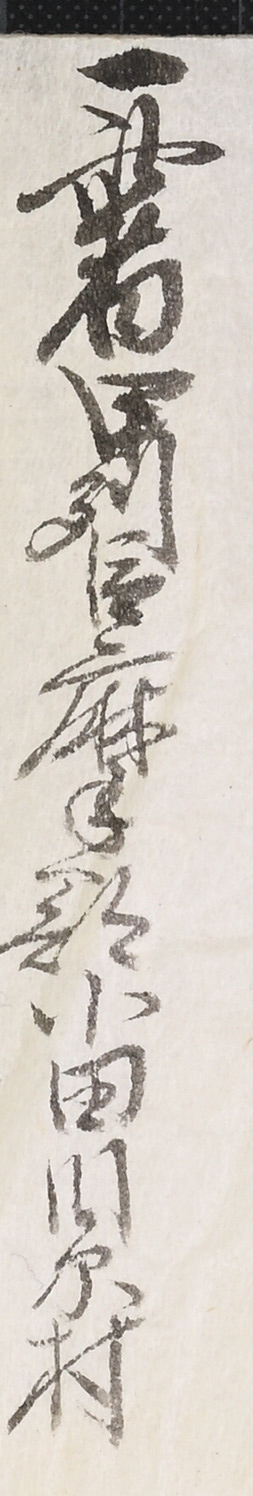一此者甲州巨摩郡小田川原村
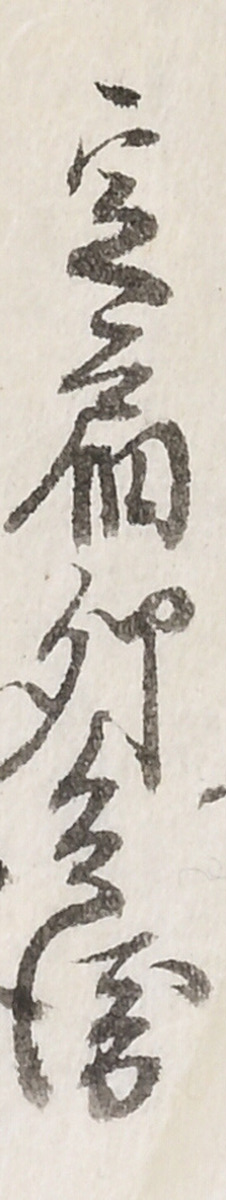定宿卯兵衛
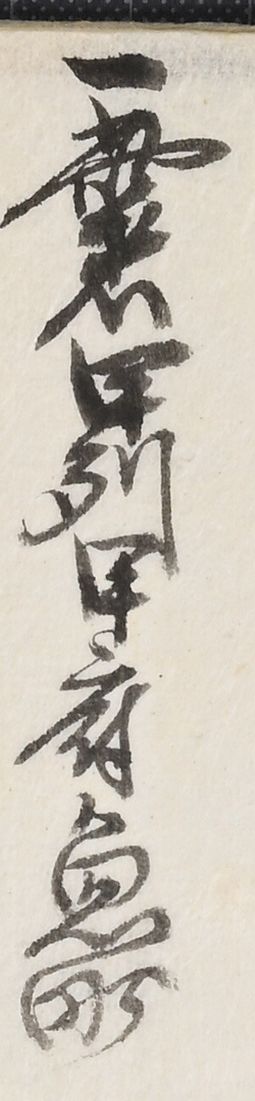一此者甲州甲府魚町
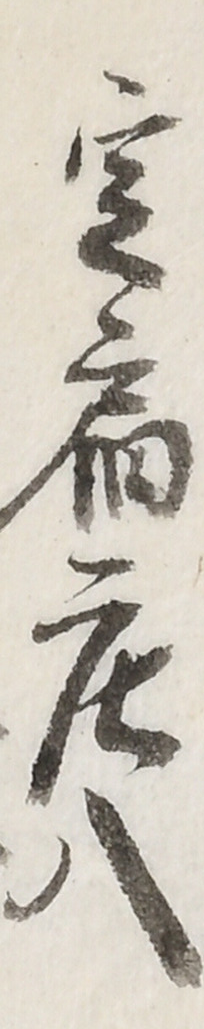定宿庄八
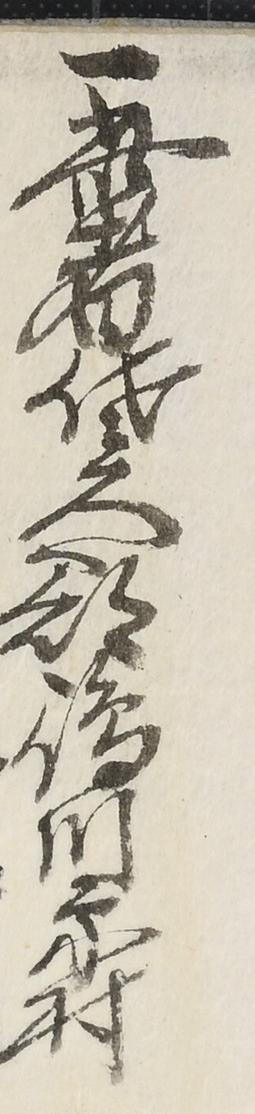一此者佐久郡島川原村
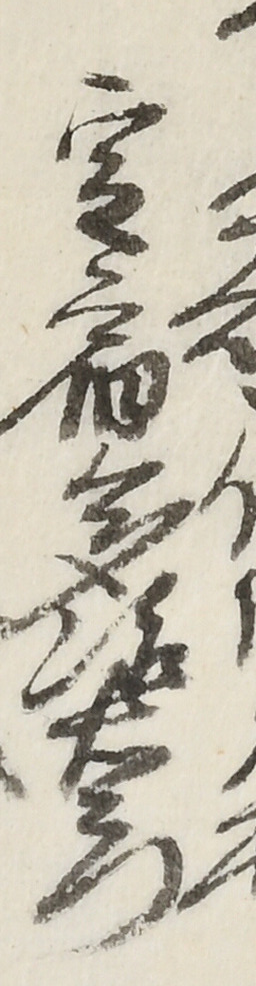定宿多治右衛門

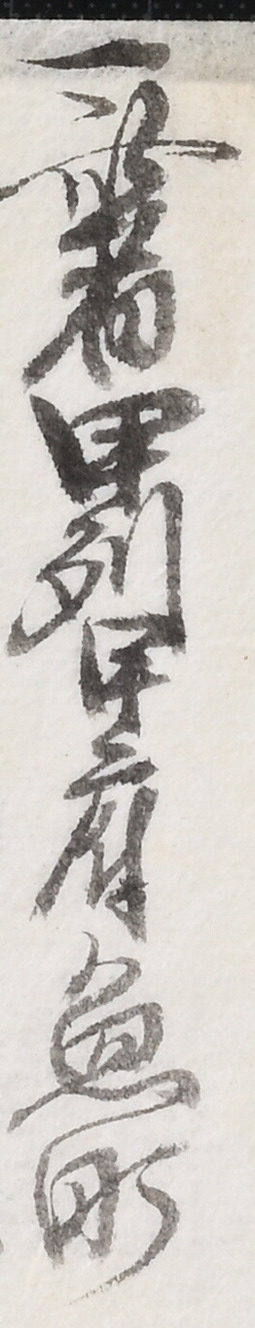一此者甲州甲府魚町
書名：慶應二丙寅年正月吉日他國出石切名前書上帳
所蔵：伊那市立高遠町図書館・合同会社AMANE
